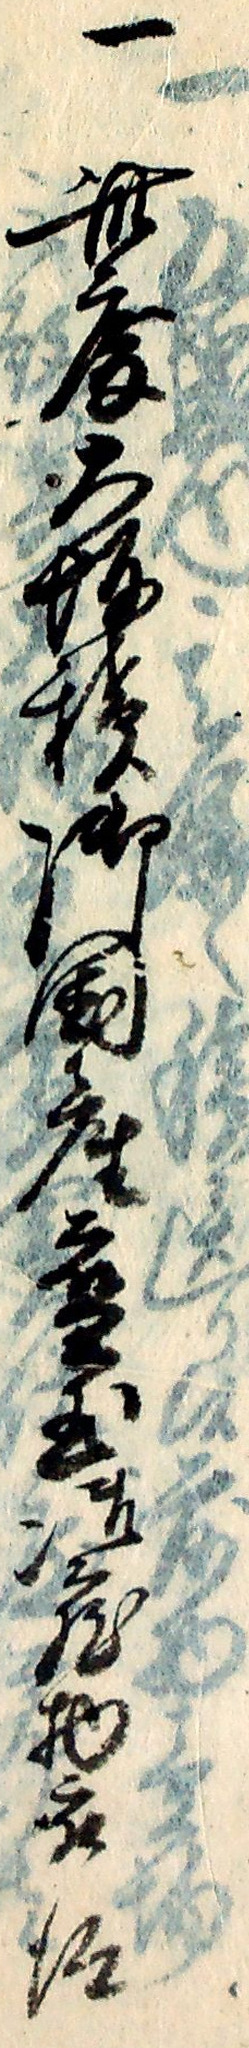一此度大坂積御国産藍玉御蔵物被仰
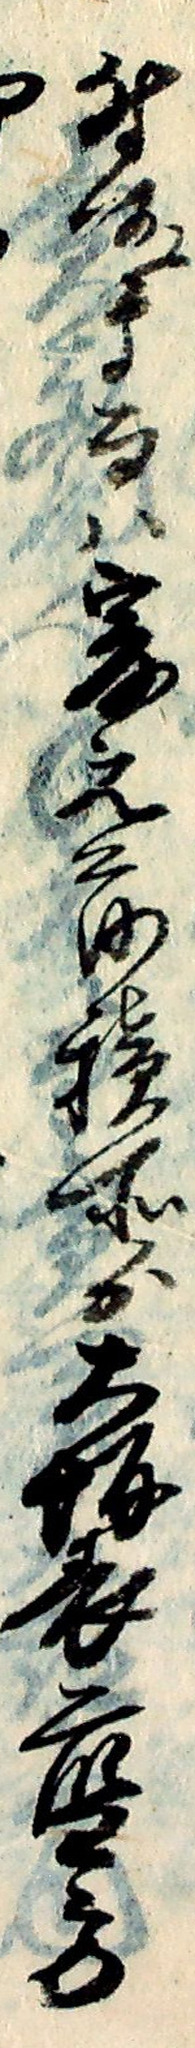付候に付ては爰元荷積所ゟ大坂表藍方
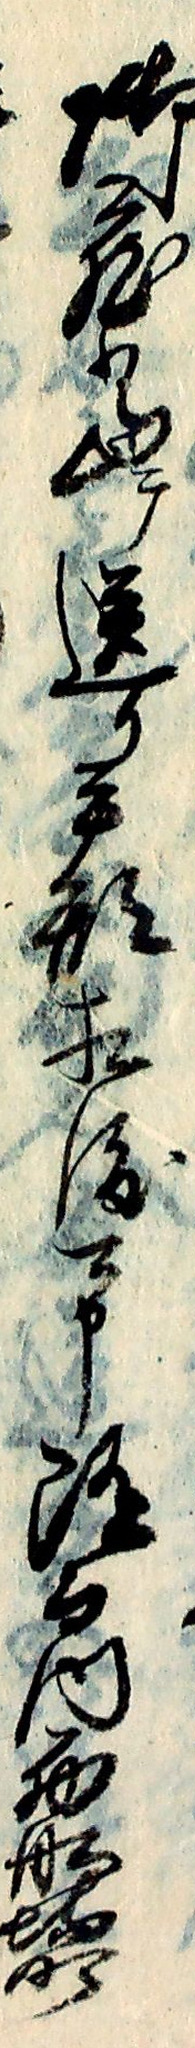御蔵当て送り手形相渡可申随て内西船場町
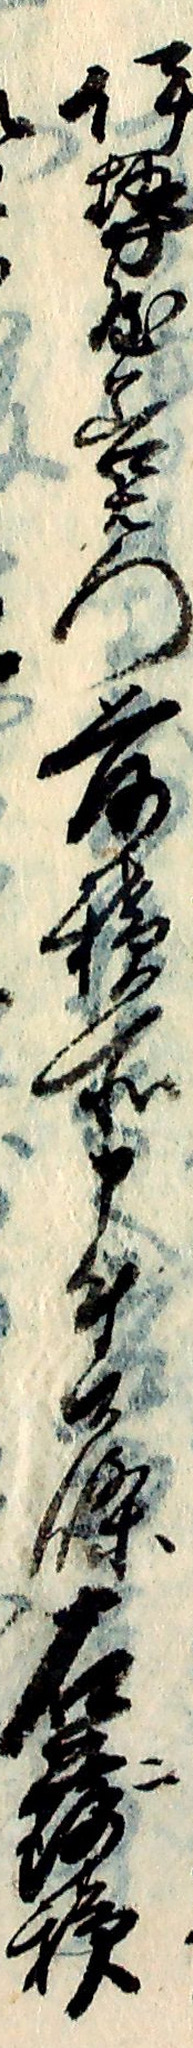伊勢屋善右衛門荷積所申付候条右荷積
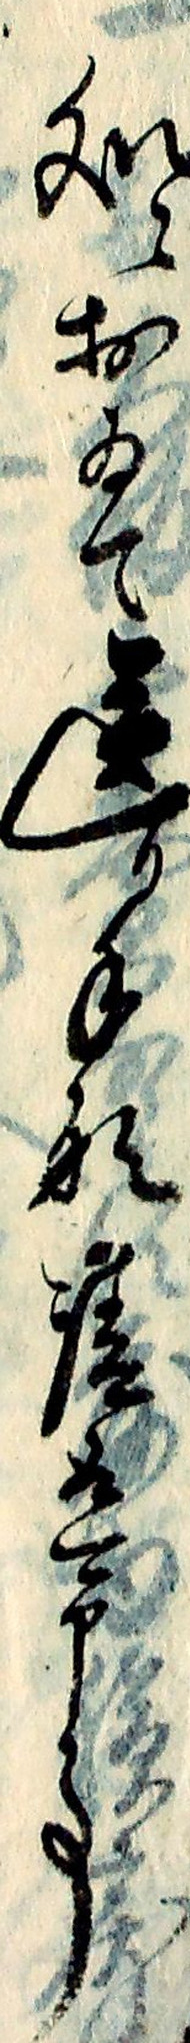処におゐて送り手形請取可申事
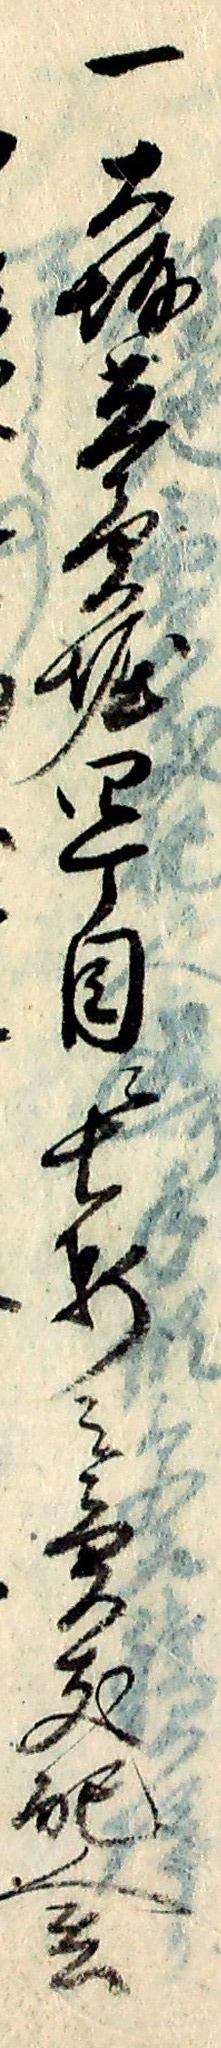一大坂立売堀四丁目に七軒之売支配人共
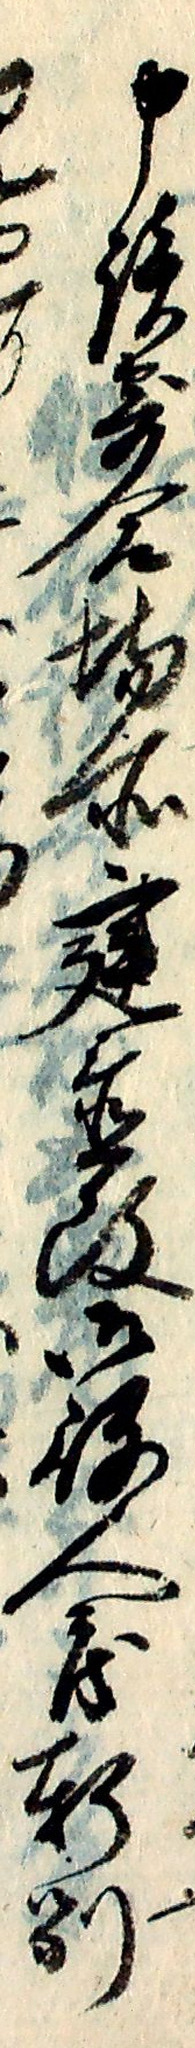申談寄合場所建置改御役人も軒別
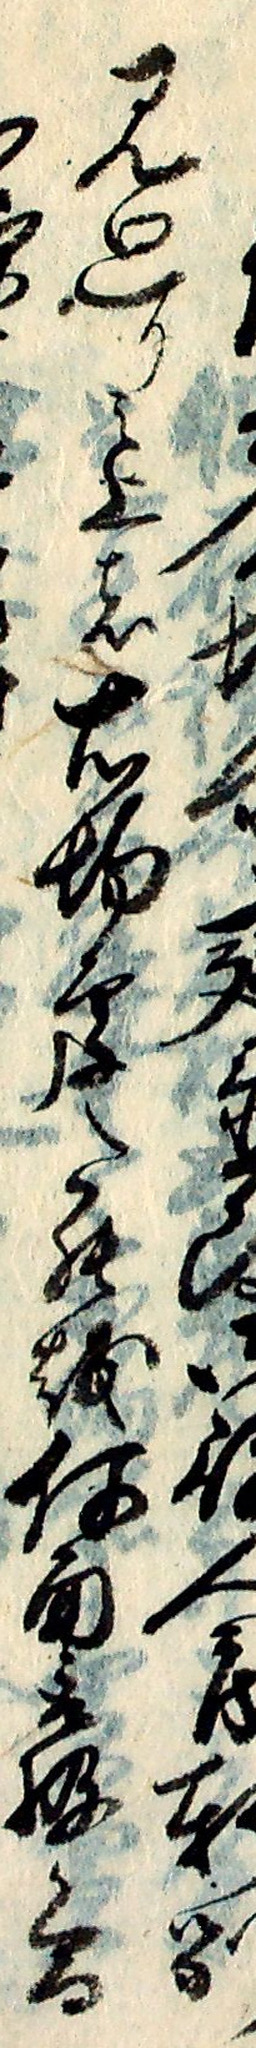見廻り之上は右場処へ罷越何面取扱候間
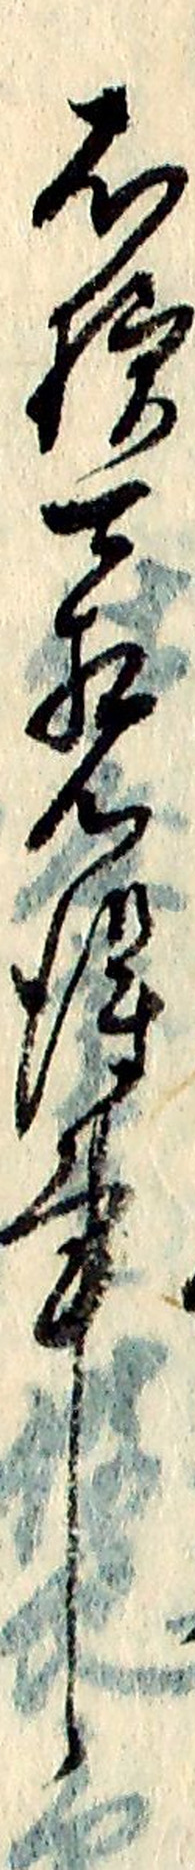右様可相心得事
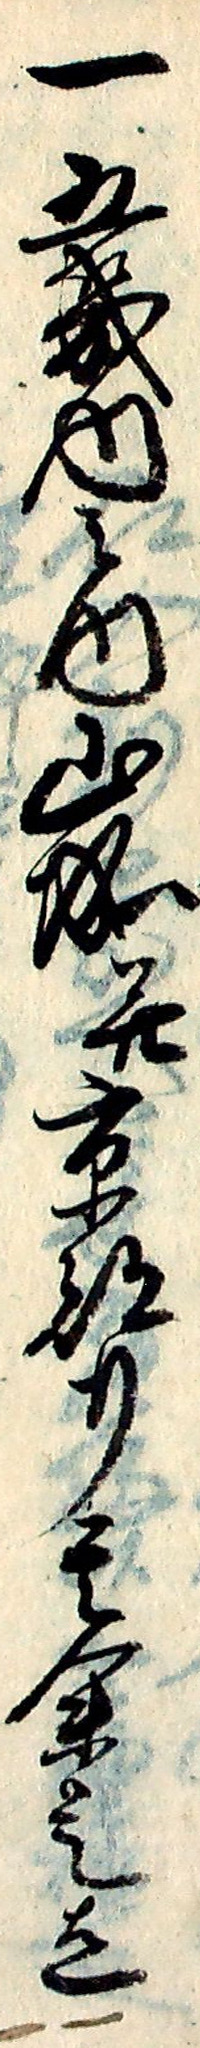一五畿内之内山城并京都行其余是迄
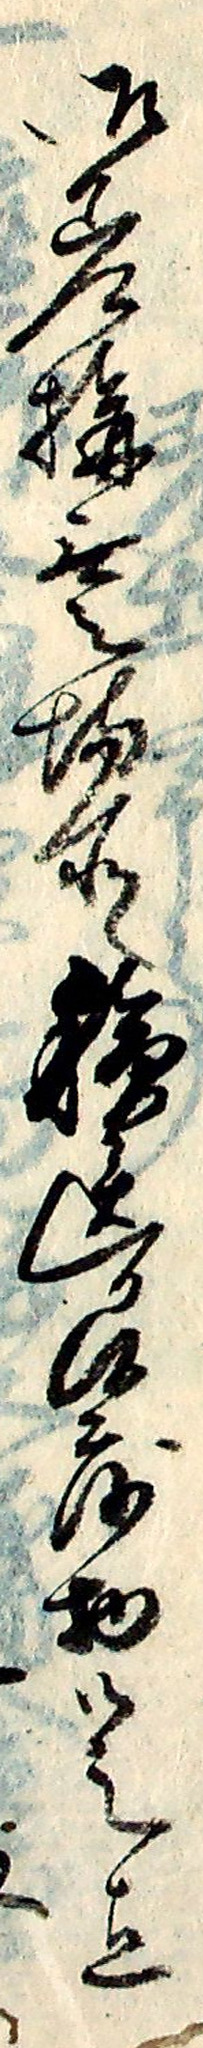御差構無之場所へ積送り候荷物是迄
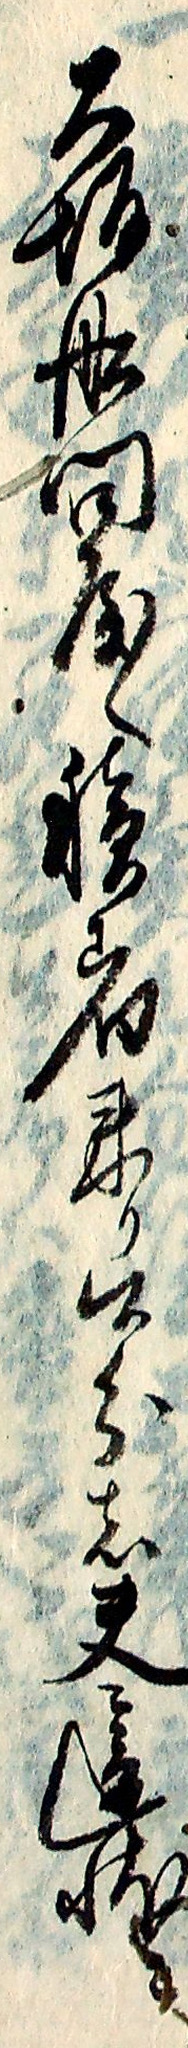大坂船問屋へ積着来り候分は夫々送状

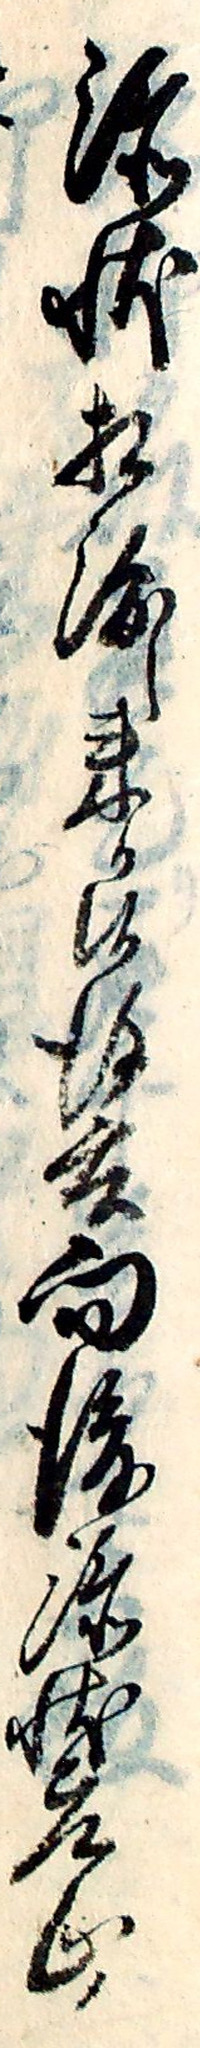添状相渡し来り候得共向後添状差止め
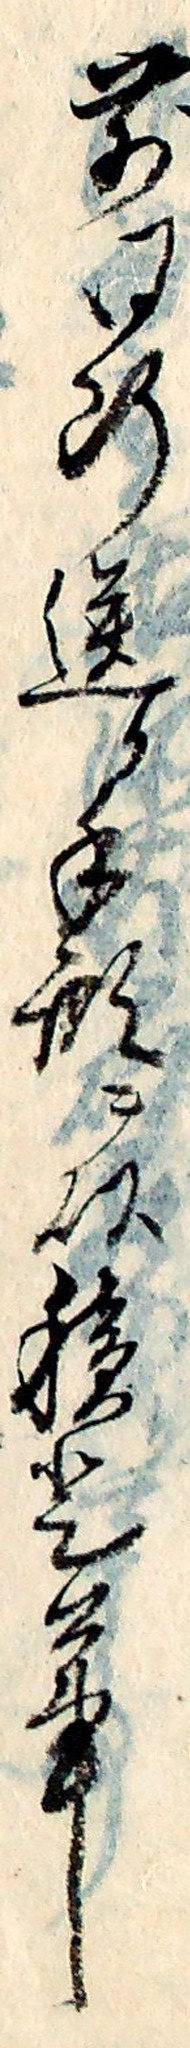前同断送り手形を以積登候事
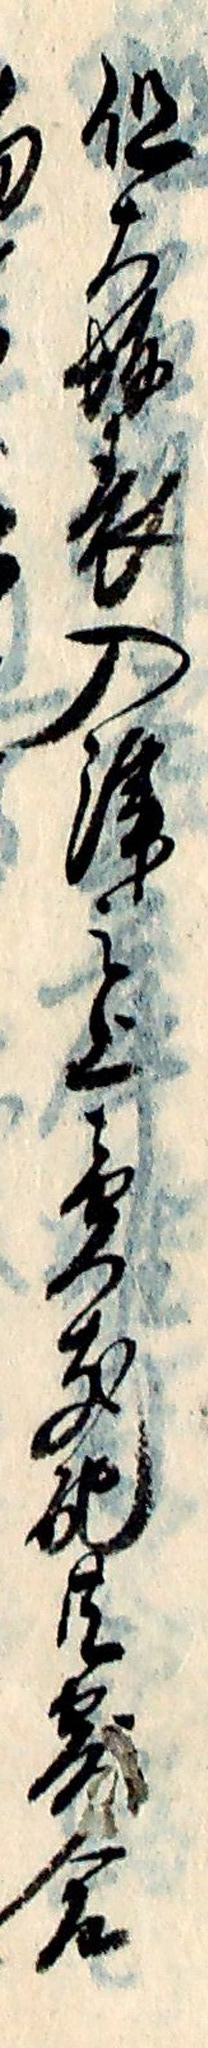但大坂表入津之上売支配共寄合
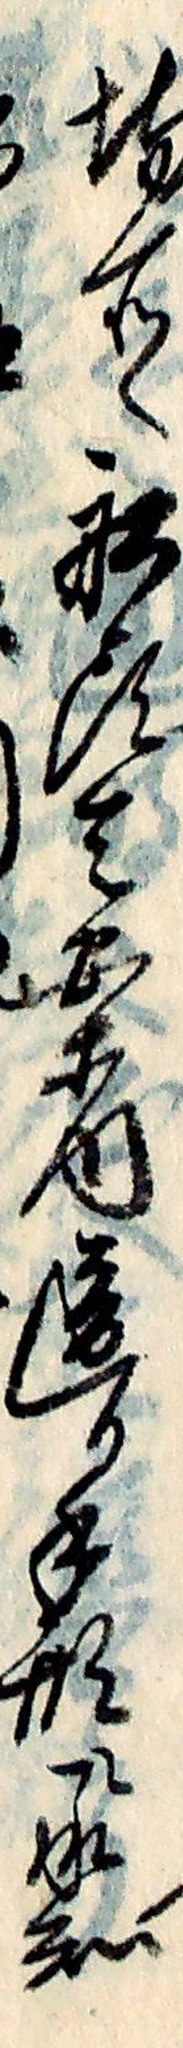場所へ船頭は案内送り手形に承知
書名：諸御願書控(後藤氏壱番）
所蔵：鳴門教育大学 Naruto University of Education
